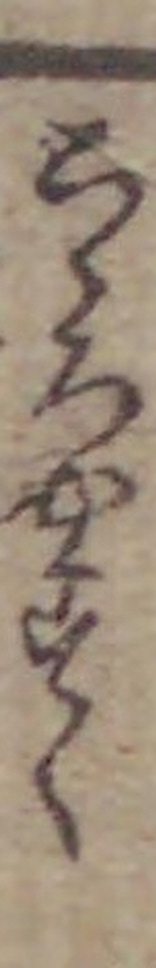こゝろやすく
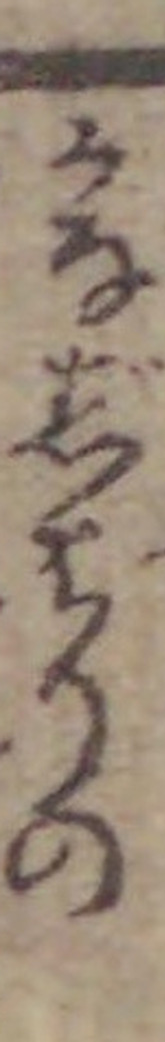かなじはりの
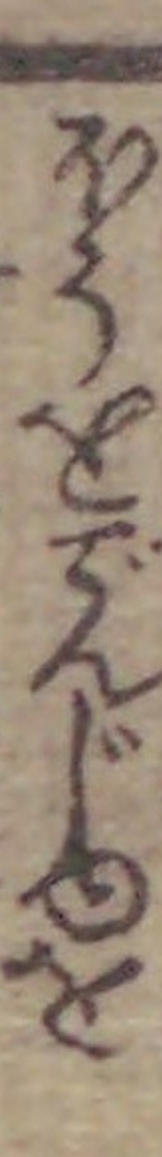ほうをでんじゆを
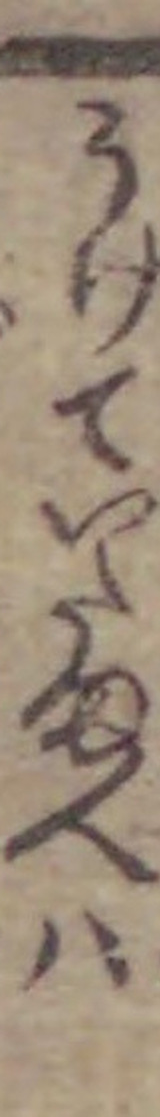うけていた両人は
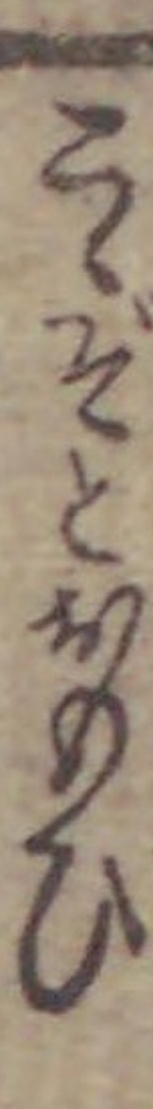こゝぞとおもひ
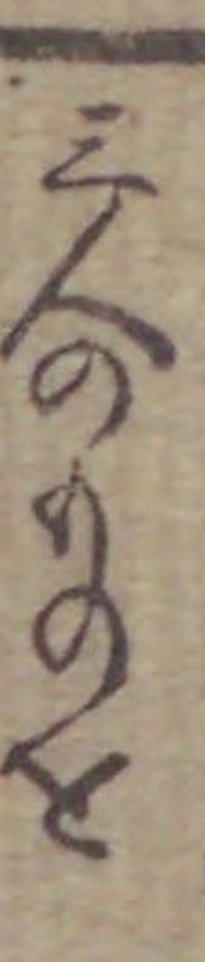三人のものを
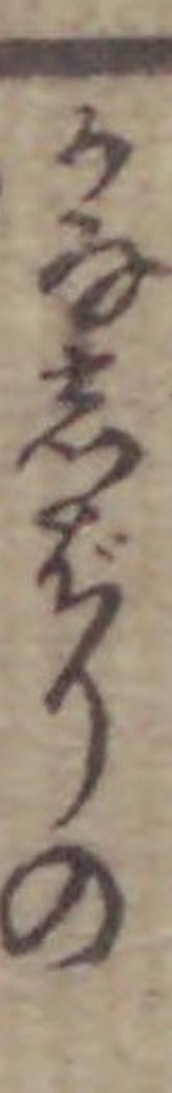かなしばりの
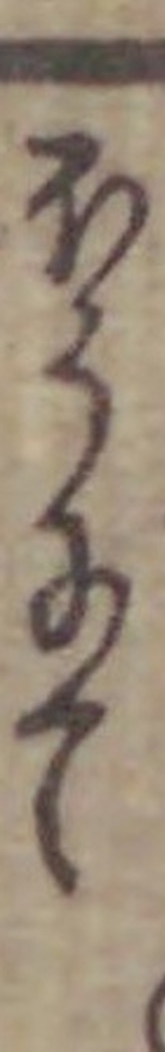ほうにて
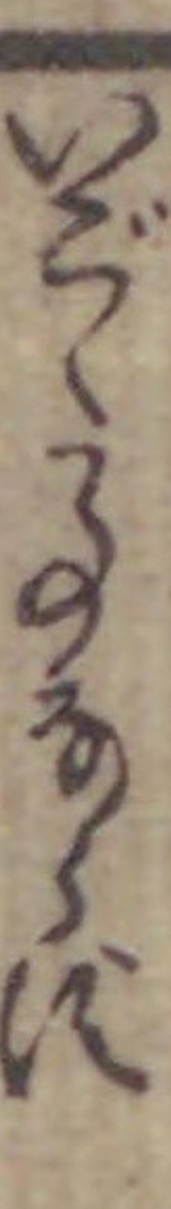いごく事ならず
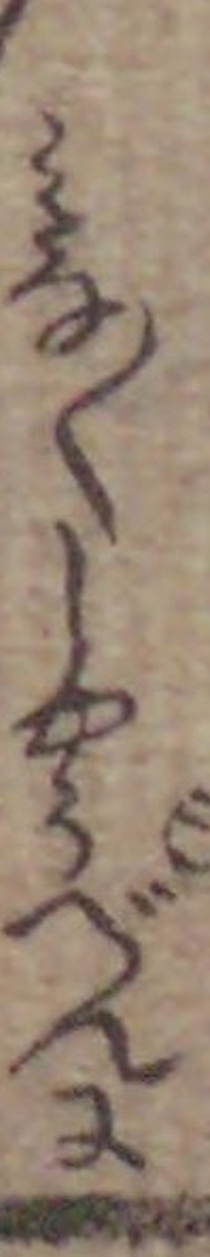みな〳〵しやうべんに
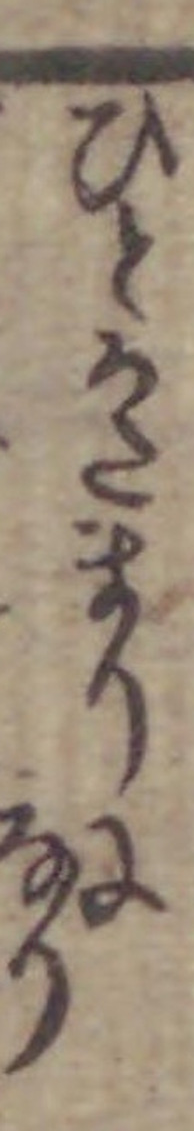ひとかたまりに
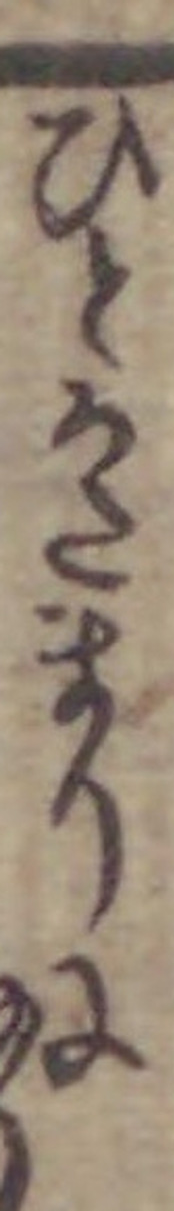ひとかたまりに
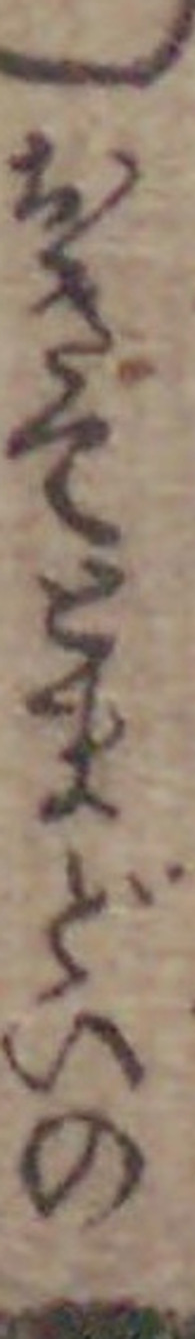おきてとまどいの
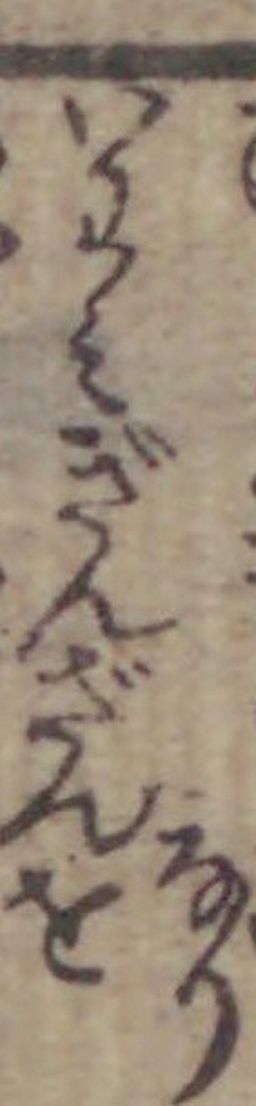いわみぎんざんを
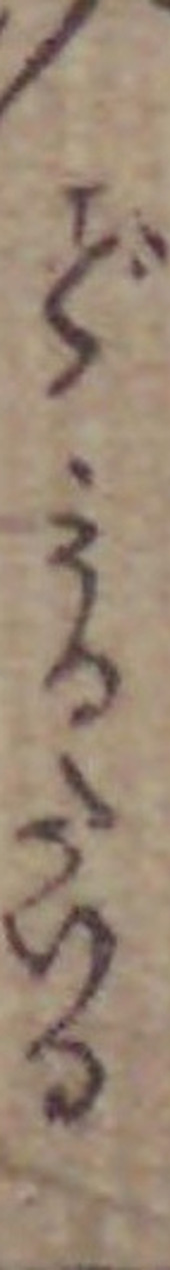ごとくうるたいる
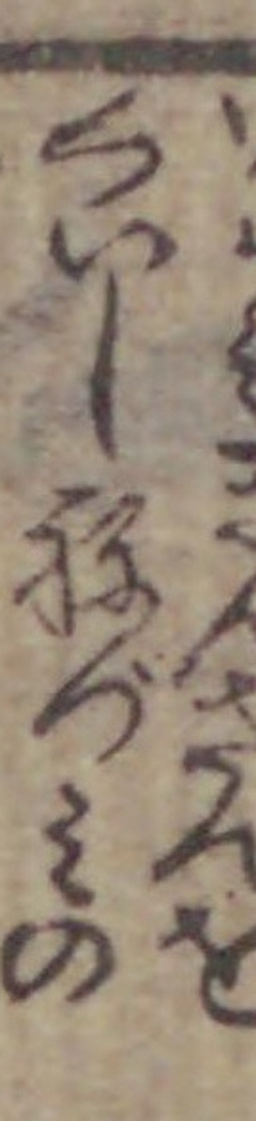くいしねずみの
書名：御代の御寶
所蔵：国立国会図書館 National Diet Library, JAPAN
